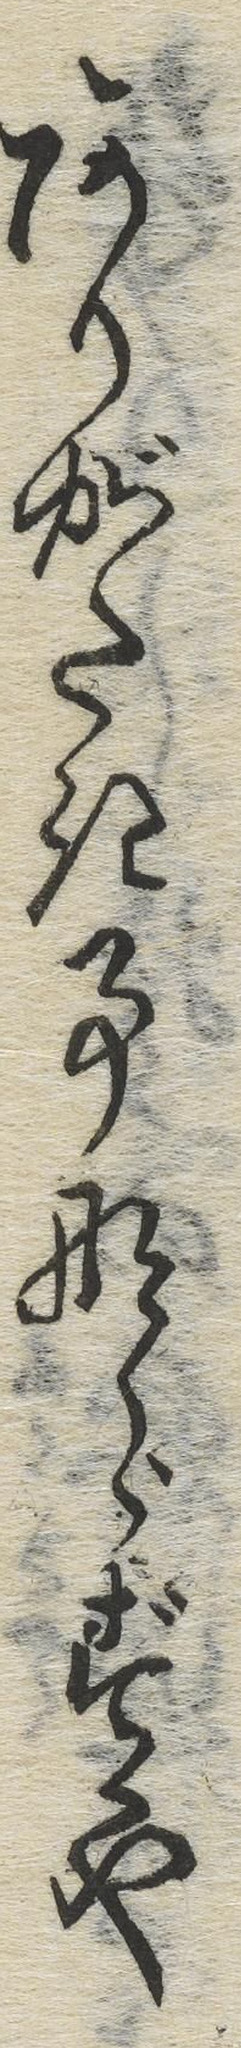ありがたき事ならずや
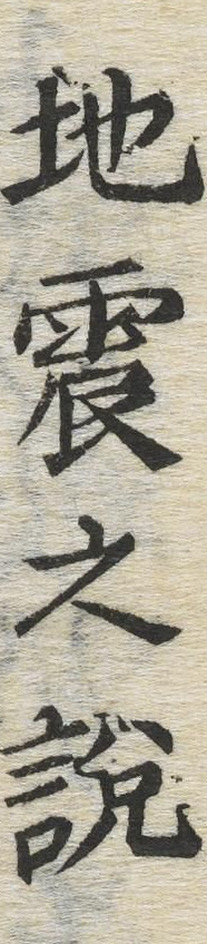地震之説
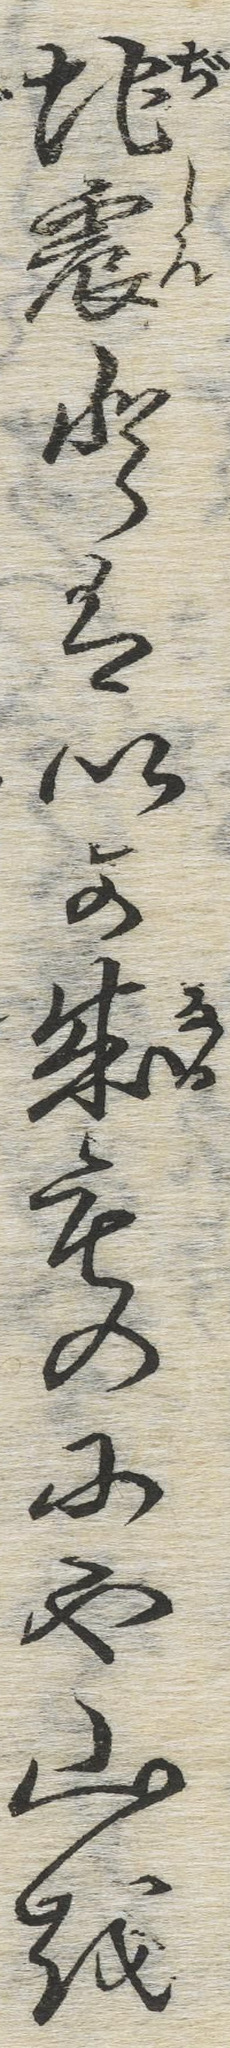地震とはいか成ものにや山を
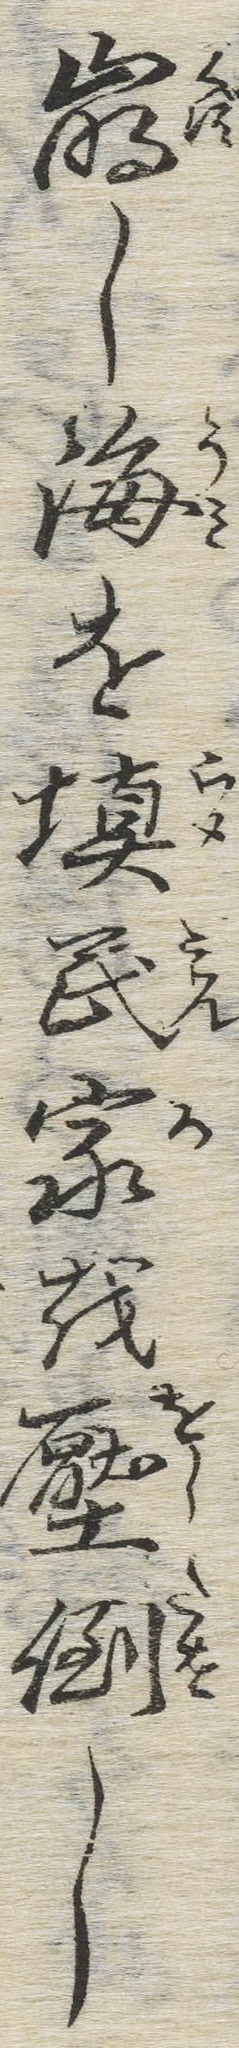崩し海を填民家を壓倒し
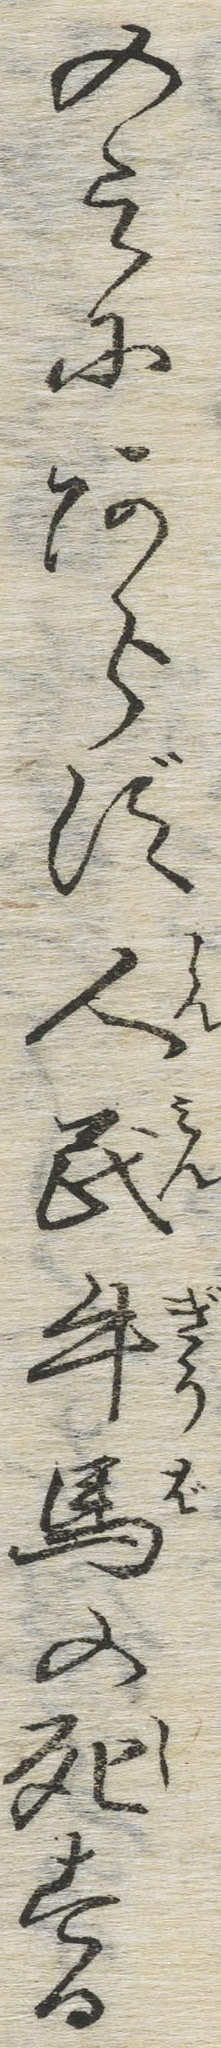のみにあらず人民牛馬の死する
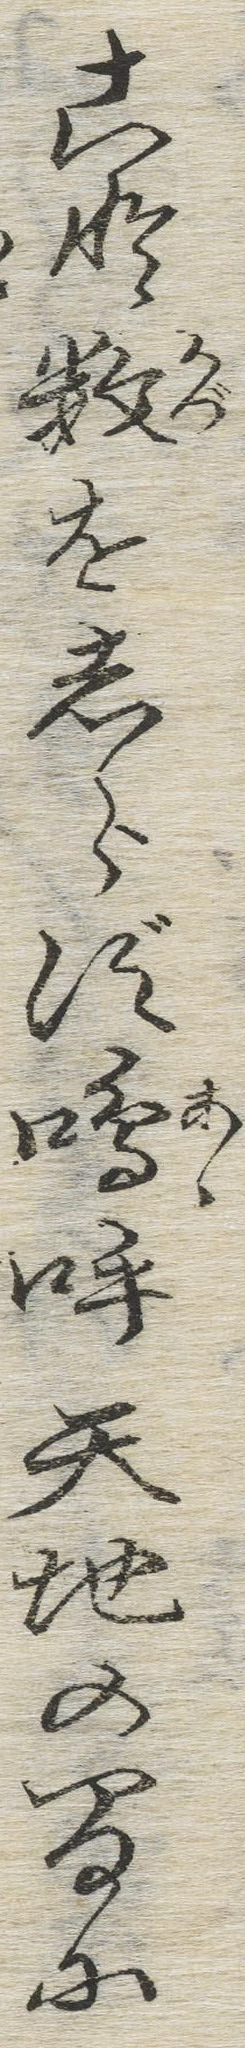こと数をしらず嗚呼天地の間に
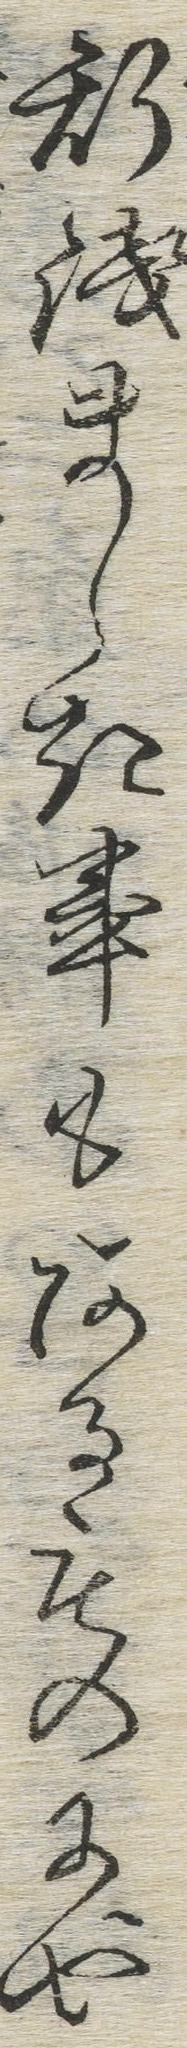斯浅ましき事もあるものにや
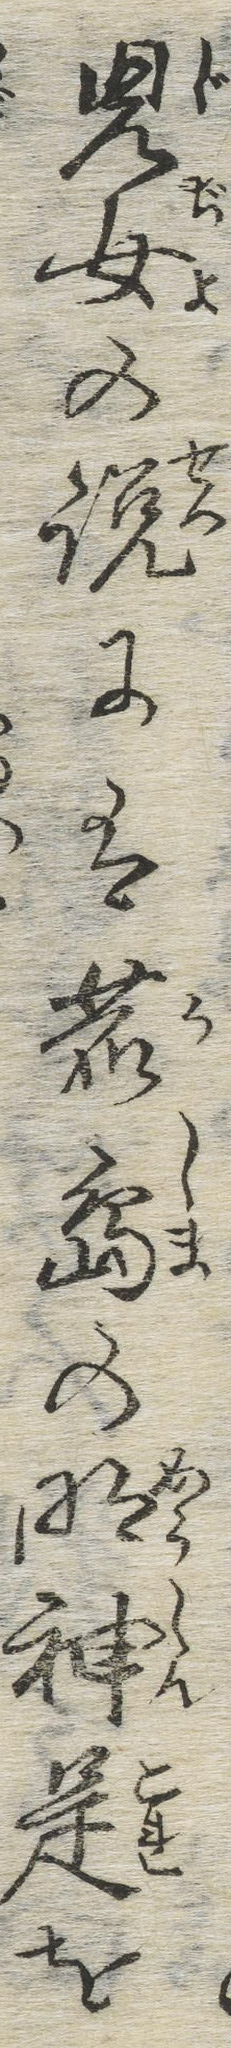児女の説には鹿島の明神是を
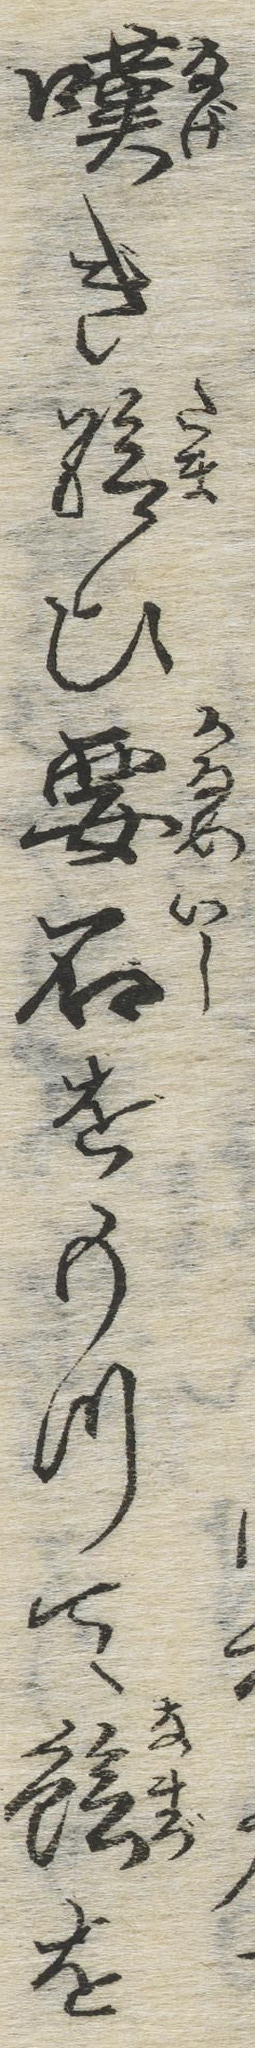嘆き給ひ要石をもつて鯰を

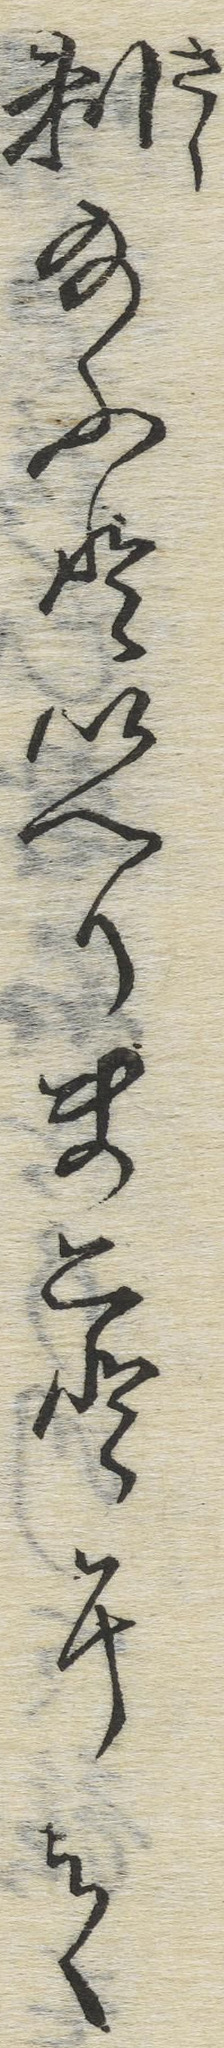刺給ふといへりまことにて
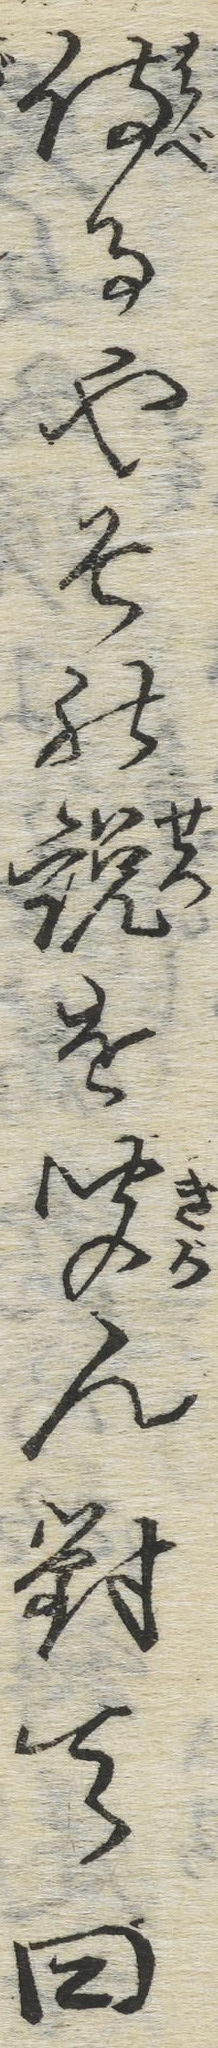侍るやその説を聞ん對て曰
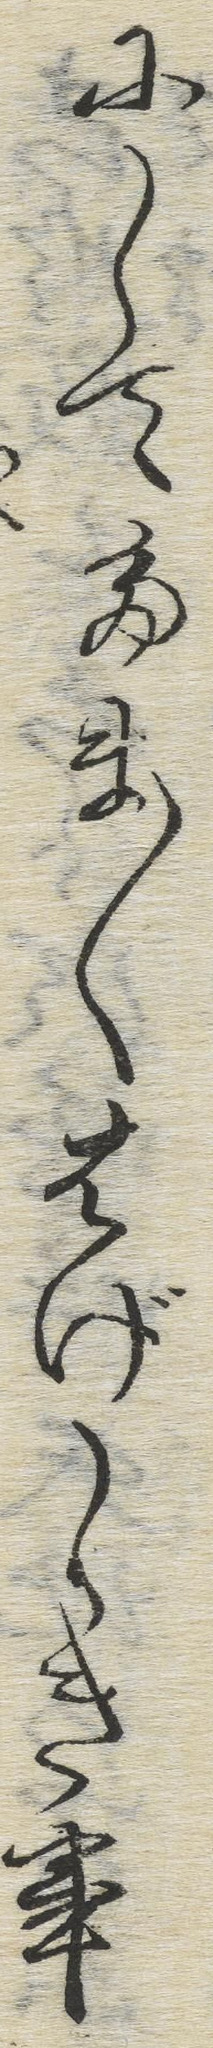にしてたま〳〵はげしき事
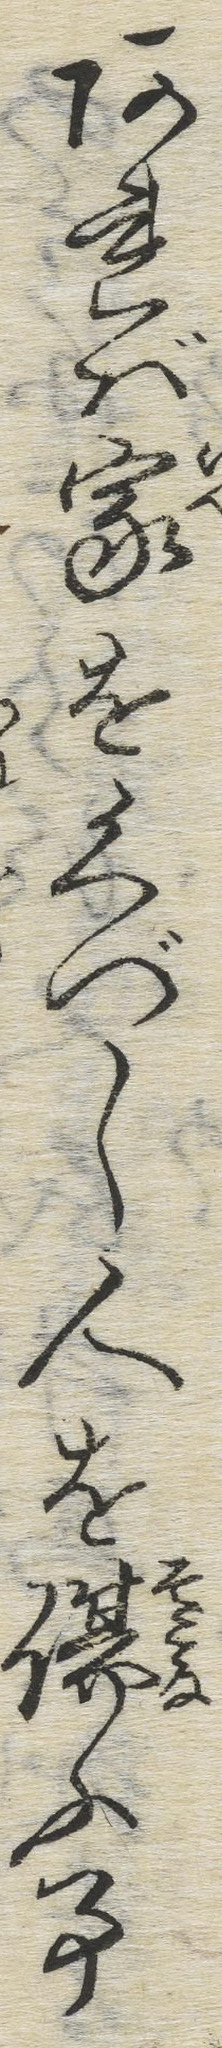あれば家をくづし人を傷ふ事
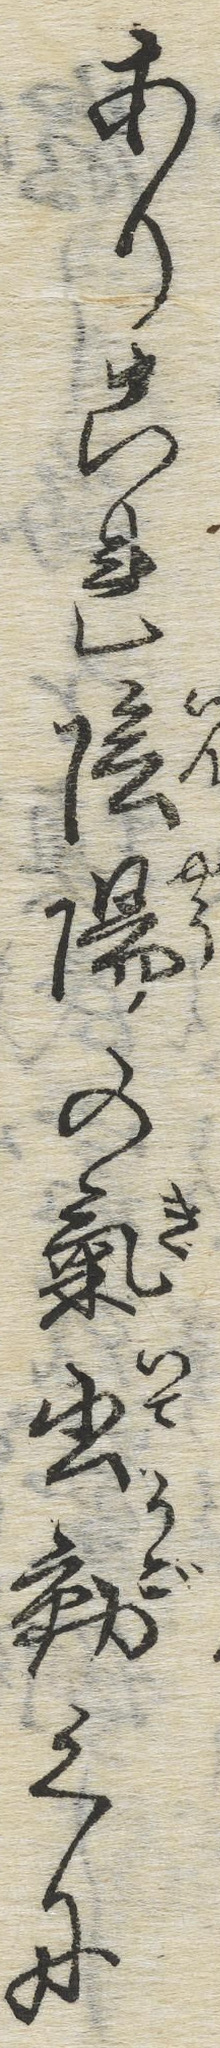ありこれ陰陽の気出動くに
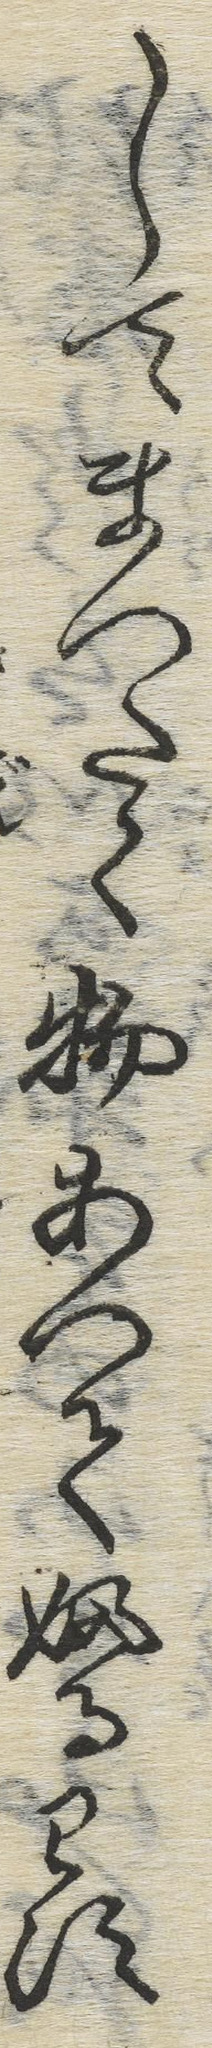してまつたく物あつてふるわす
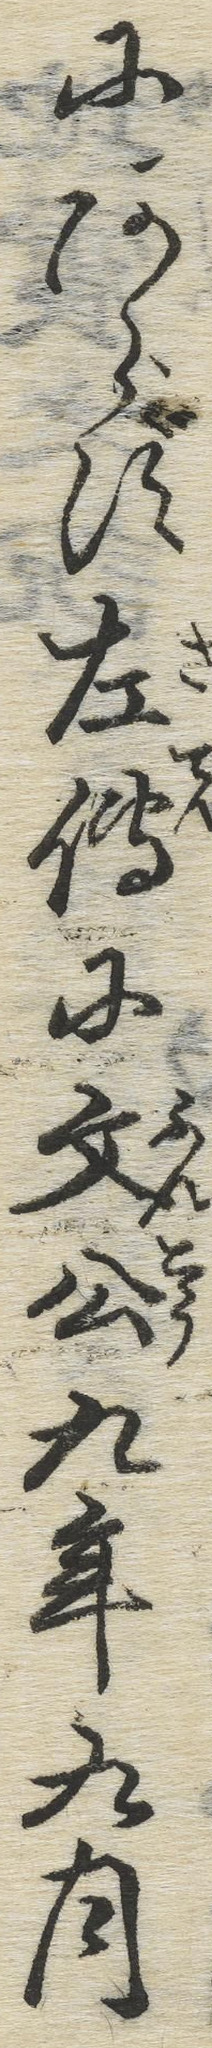にあらず左伝に文公九年九月
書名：雷公地震由來記　全
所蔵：東京大学地震研究所図書室 Earthquake Research Institute Library, The University of Tokyo, JAPAN
